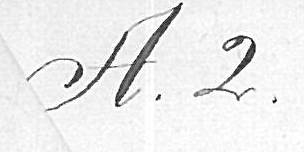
A. 2.
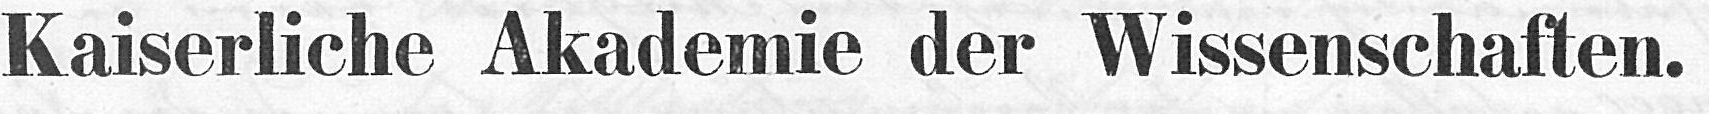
Kaiserliche Akademie der Wissenschaften.
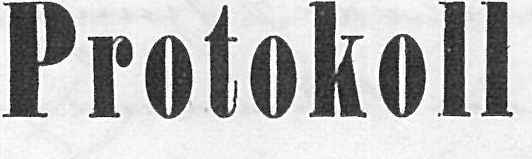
Protokoll
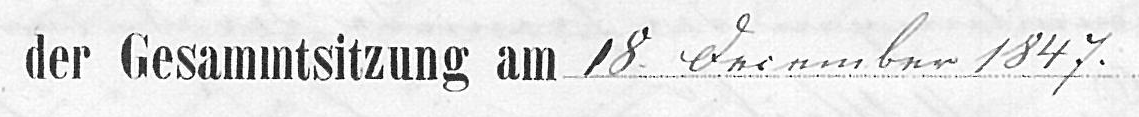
Gesammtsitzung am 18. December 1847.
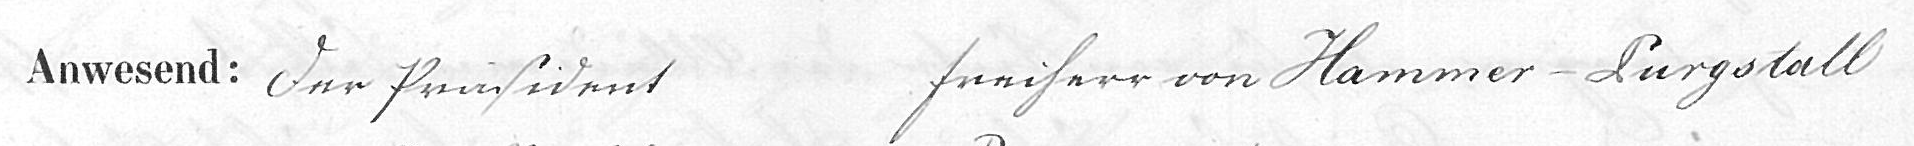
Anwesend: Der Präsident Freiherr von Hammer-Purgstall
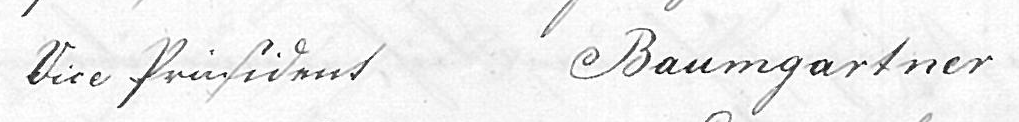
" Vice-Präsident Baumgartner
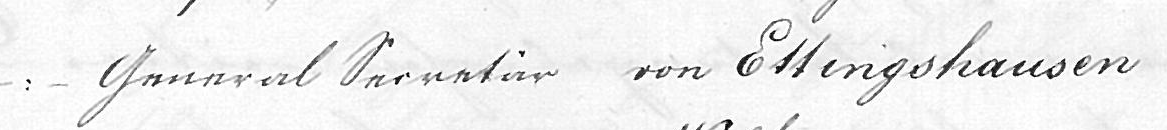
" General Secretär von Ettingshausen
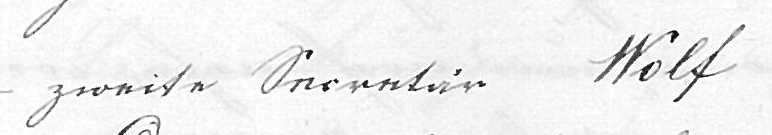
" zweite Gecretär Wolf
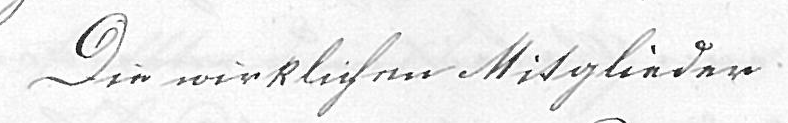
Die wirklichen Mitglieder
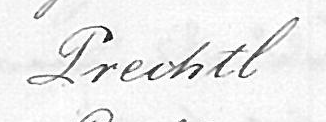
Prechtl
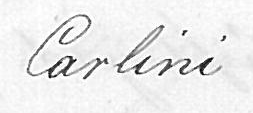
Carlini
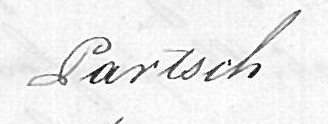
Partsch
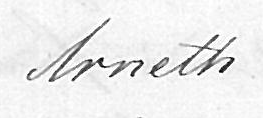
Arneth
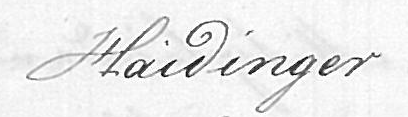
Haidinger
